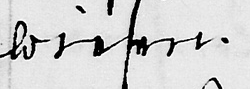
wiesen.
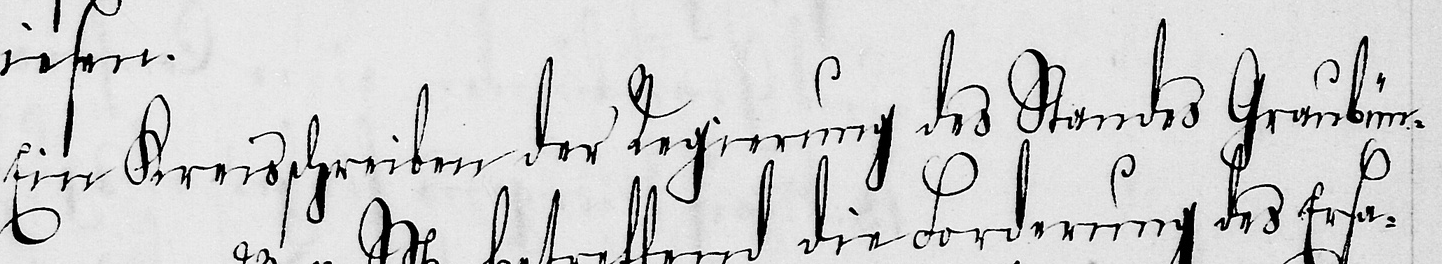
Ein Kreisschreiben der Regierung des Standes Graubün¬
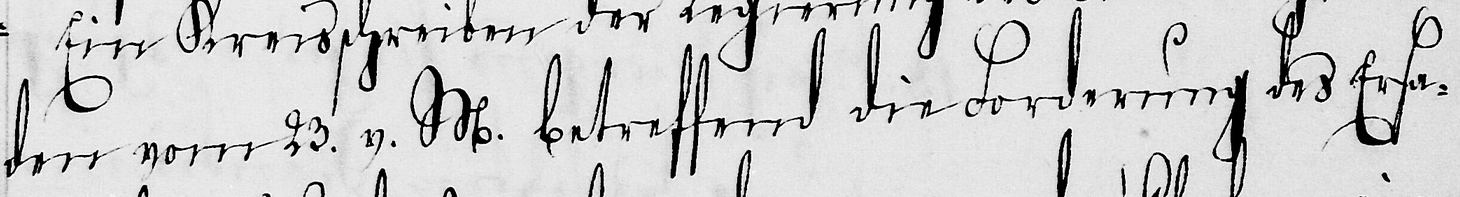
den vom 23. v. M. betreffend die Forderung des Ers¬
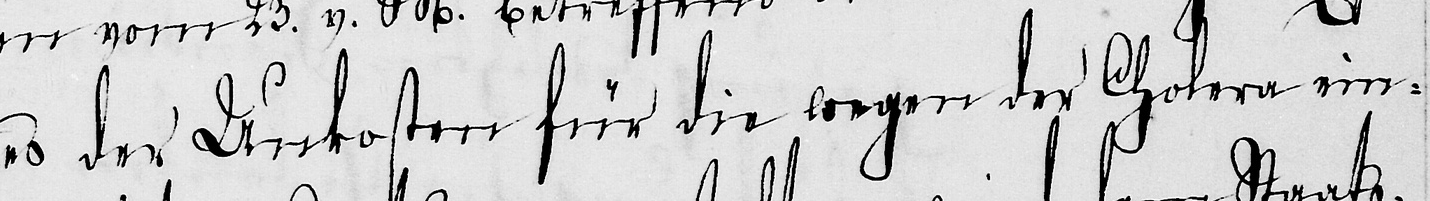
es der Unkosten für die wegen der Cholera ein¬
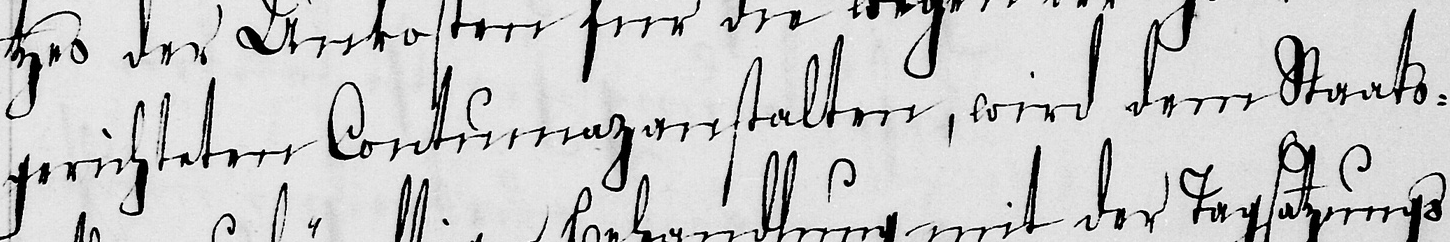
gerichteten Contumazanstalten, wird dem Staats¬
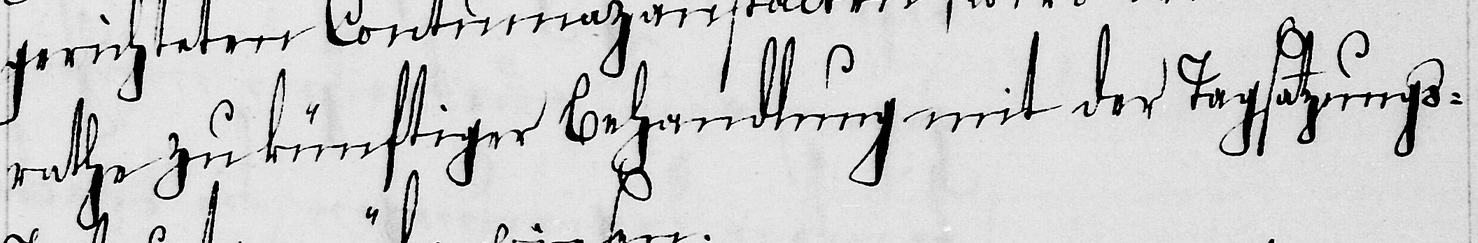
rathe zu künftiger Behandlung mit der Tagsatzung¬
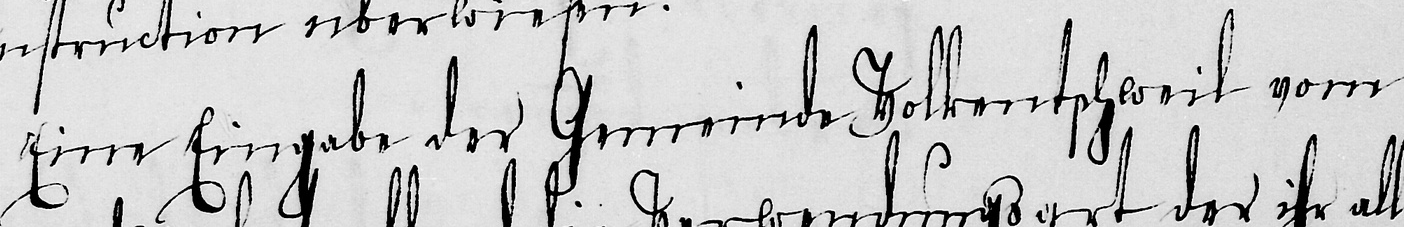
Eine Eingabe der Gemeinde Volkentschweil vom
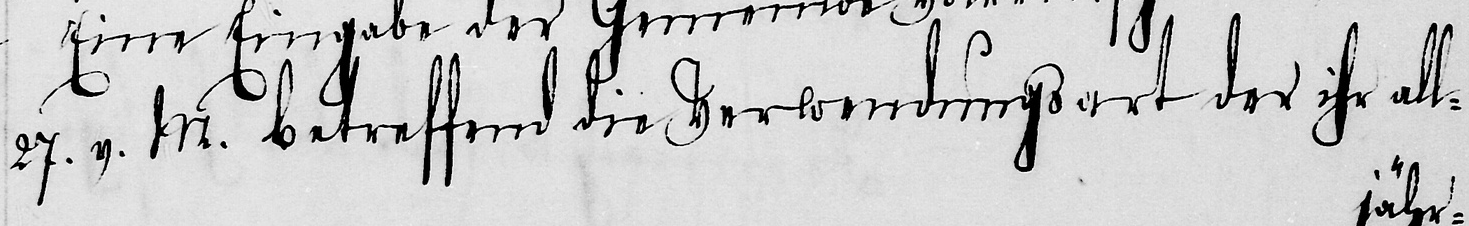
27. v. M. betreffend die Verwendungsart der ihr all-
